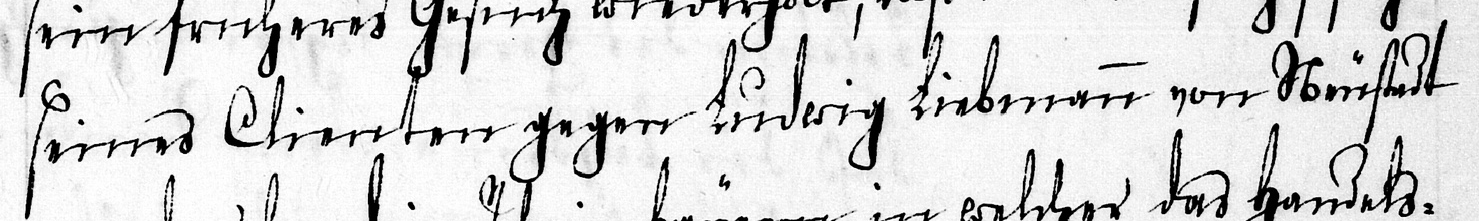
seines Clienten gegen Ludwig Liebmann von Neustadt
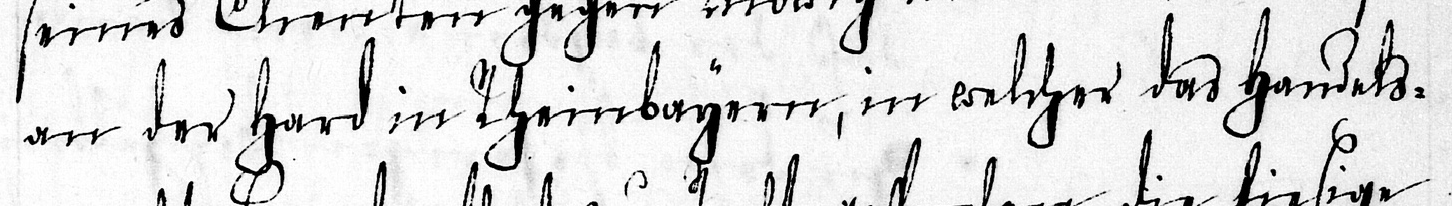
an der Hard in Rheinbayern, in welcher das Handels¬
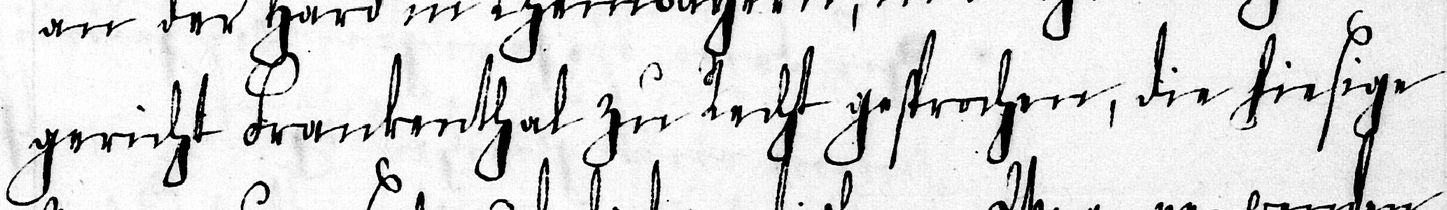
gericht Frankenthal zu Recht gesprochen, die hiesige
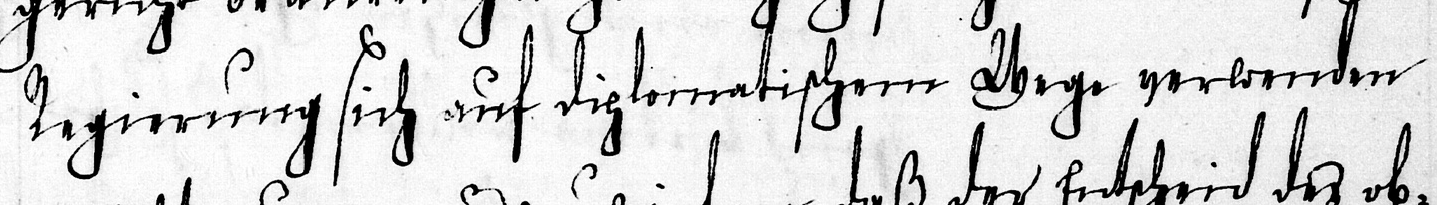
Regierung sich auf diplomatischem Wege verwenden
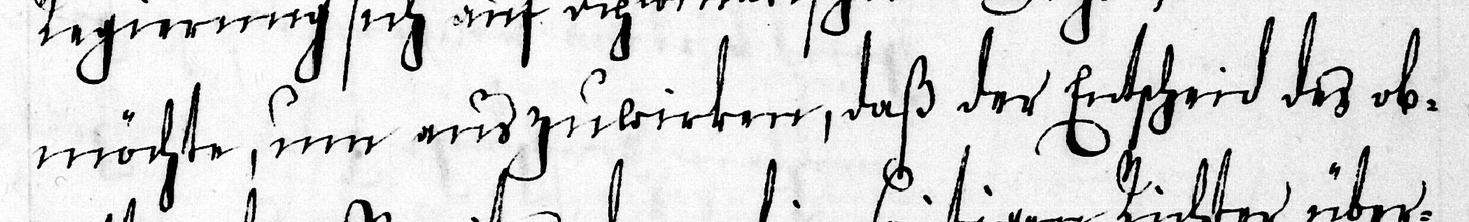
möchte, um auszuwirken, daß der Entscheid des ob¬
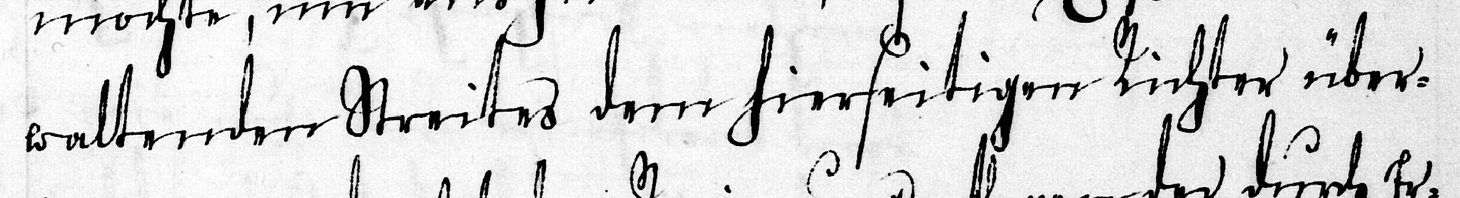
waltenden Streites dem hierseitigen Richter über¬
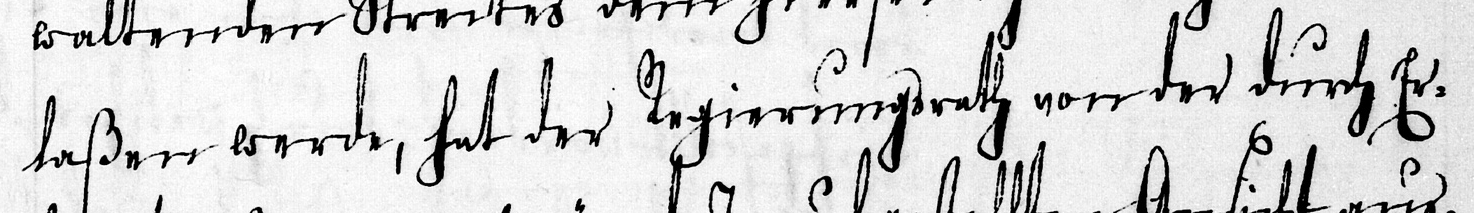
laßen werde, hat der Regierungsrath von der durch Er¬
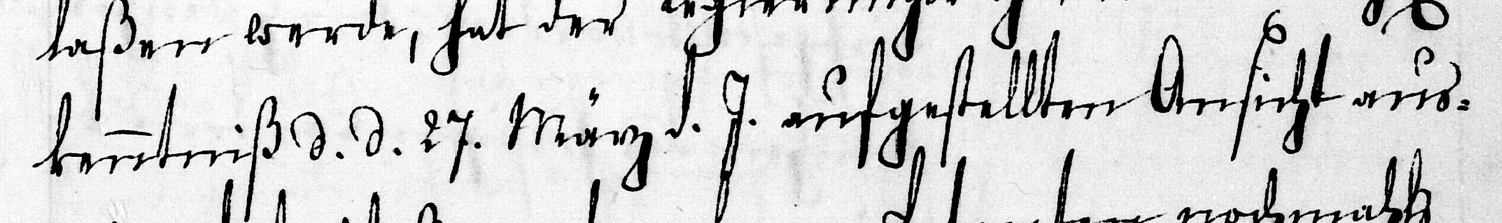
kenntniß d. d. 27. März d. J. aufgestellten Ansicht aus¬
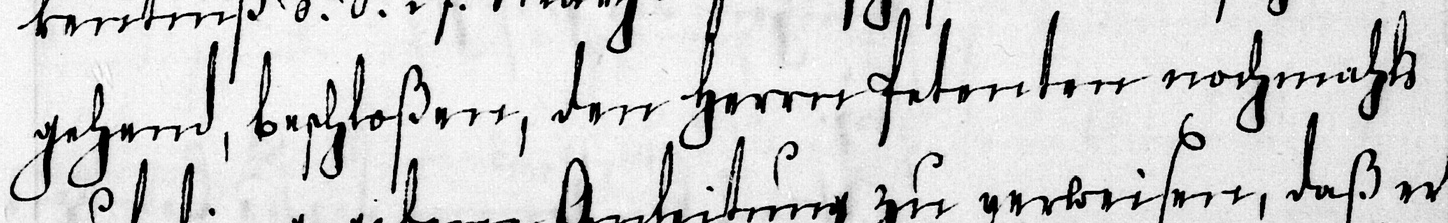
gehend, beschloßen, den Herrn Petenten nochmahls
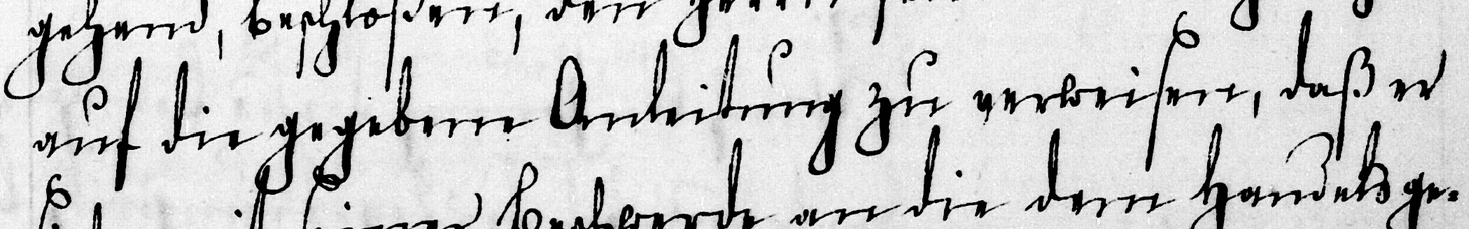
auf die gegebene Anleitung zu verweisen, daß er
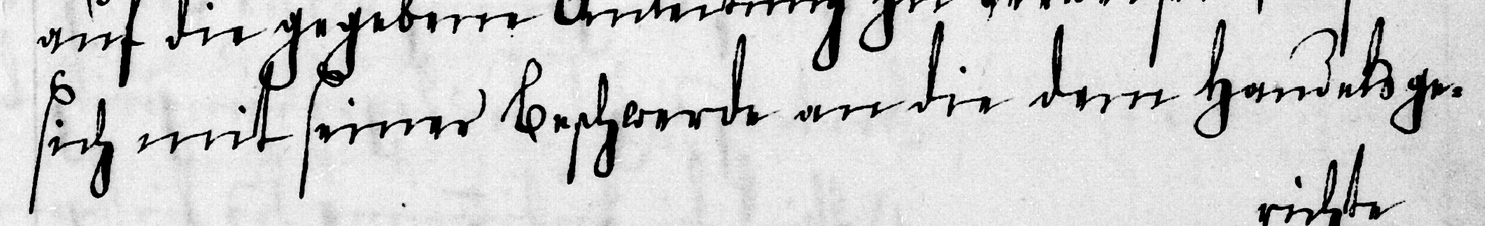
sich mit seiner Beschwerde an die dem Handelsge-
